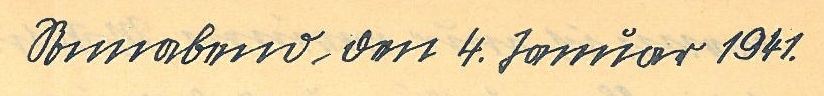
Sonnabend, den 4. Januar 1941.
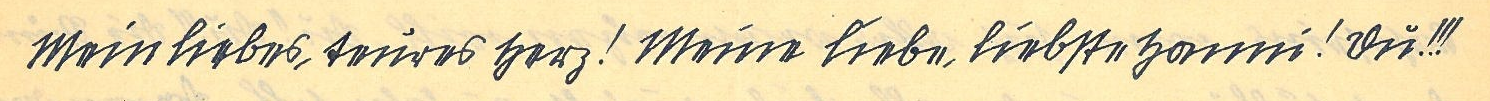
Mein liebes, teures Herz! Meine liebe, liebste ! Du!!!
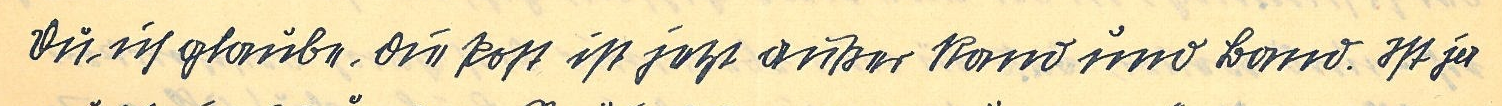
Du, ich glaube, die Post ist jetzt außer Rand und Band. Ist ja
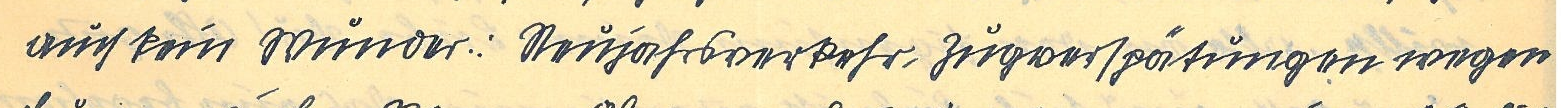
auch kein Wunder.: Neujahrsverkehr, Zugverspätungen wegen
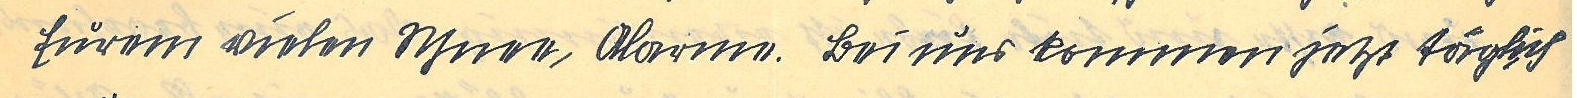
Eurem vielen Schnee, Alarme. Bei uns kommen jetzt täglich
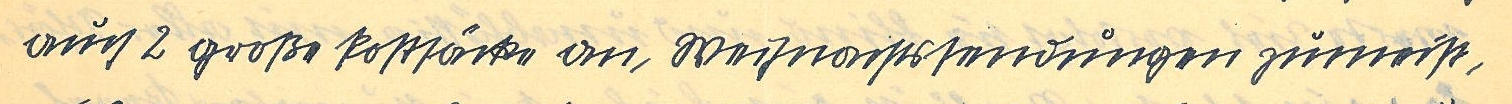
auch 2 große Postsäcke an, Weihnachtssendungen zumeist,
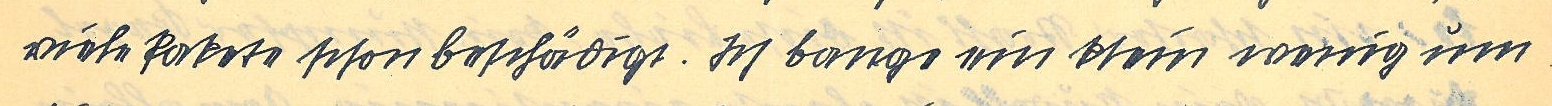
viele Pakete schon beschädigt. Ich bange ein klein wenig um
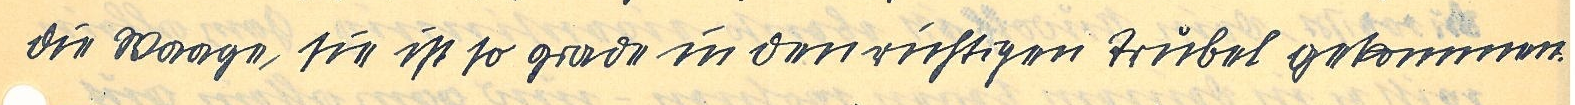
die Waage, sie ist so grade in den richtigen Trubel gekommen.
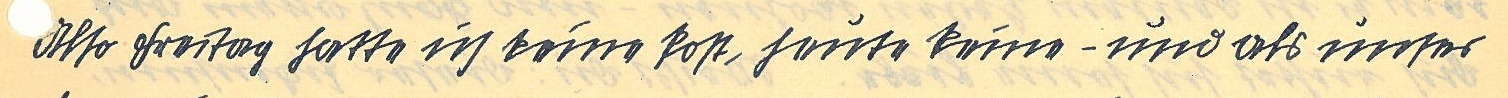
lso Freitag hatte ich keine Post, heute keine – und als unser
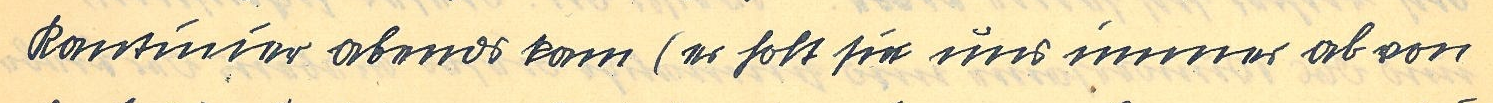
Kantinier abends kam (er holt sie uns immer ab von
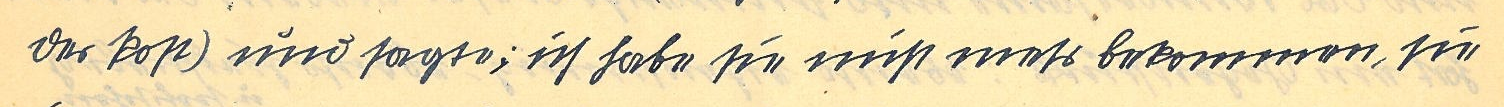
der Post) und sagte:, ich habe sie nicht mehr bekommen, sie
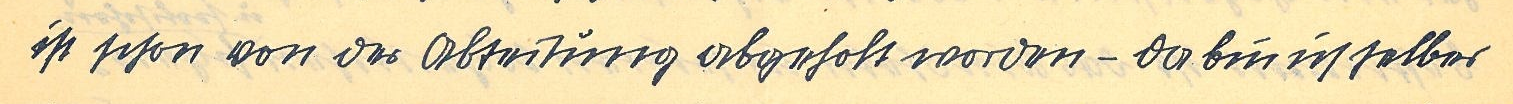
ist schon von der Abteilung abgeholt worden – da bin ich selber
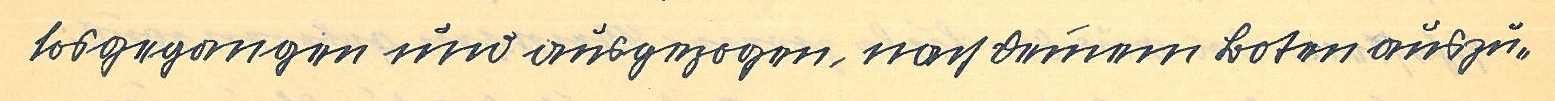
losgegangen und ausgezogen, nach Deinem Boten auszu¬
